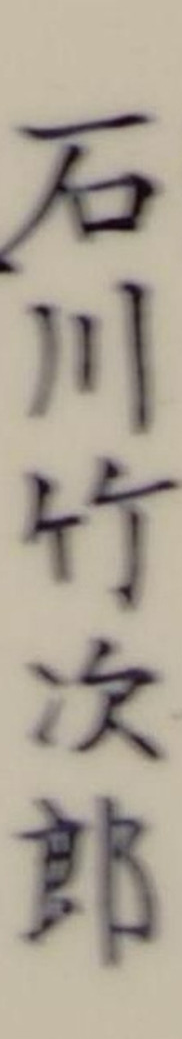石川竹次郎
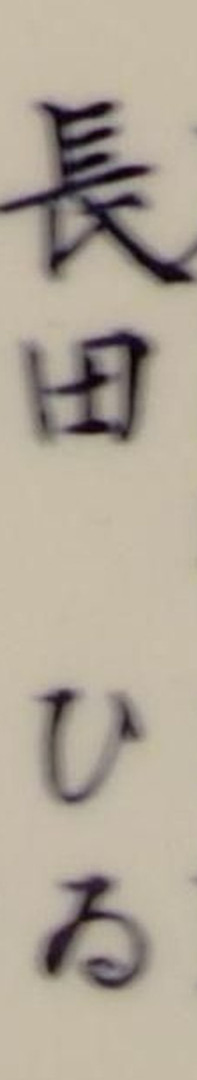長田ひゐ
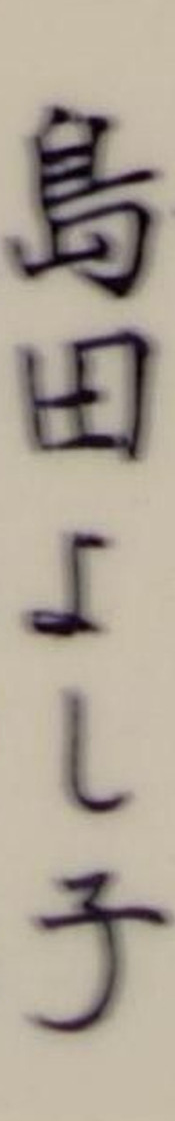島田よし子
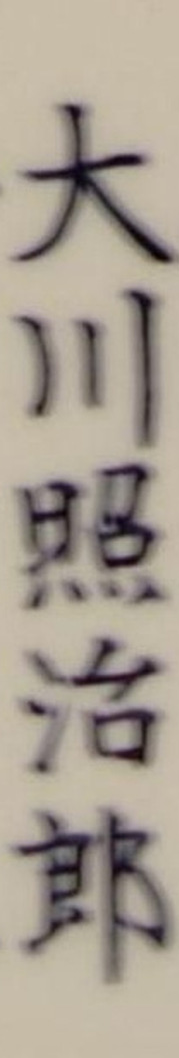大川照治郎
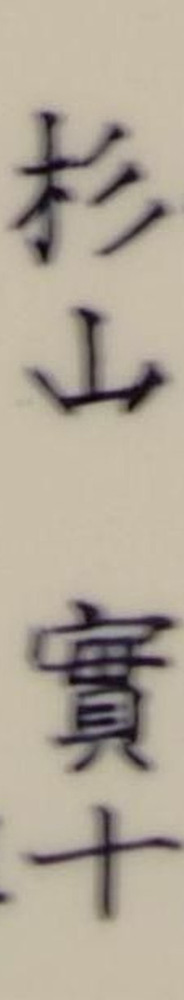杉山実十
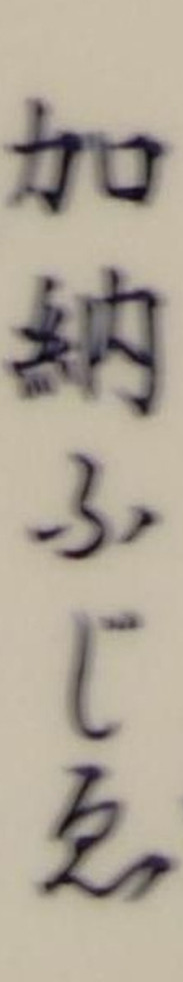加納ふじゑ
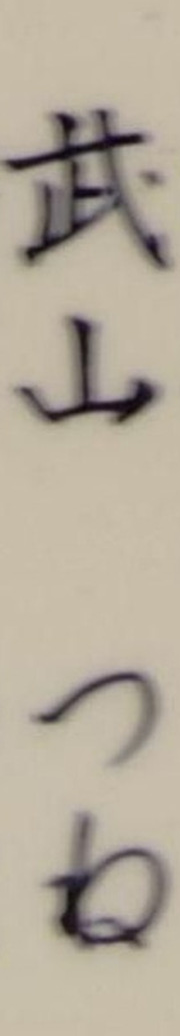武山つね
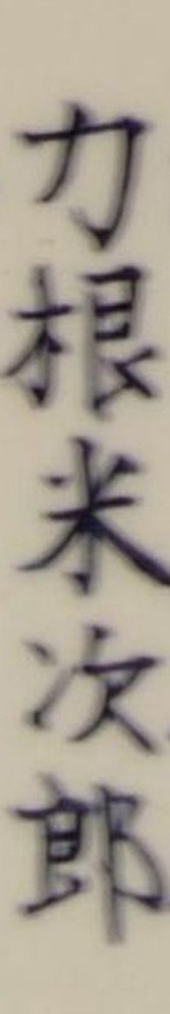力根米次郎
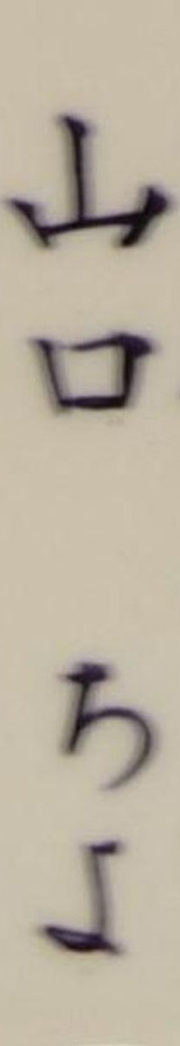山口ちよ
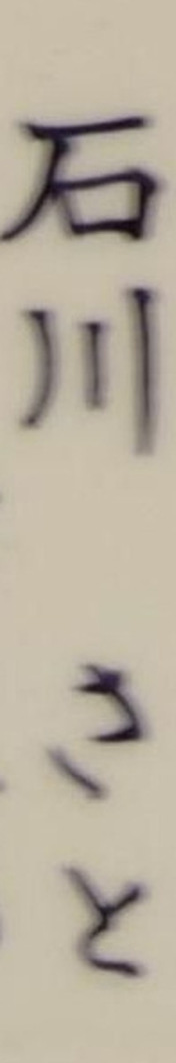石川さと
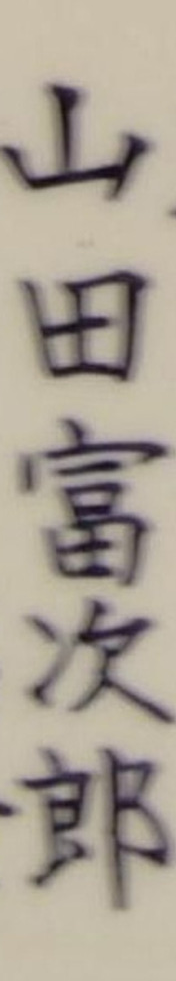山田富次郎
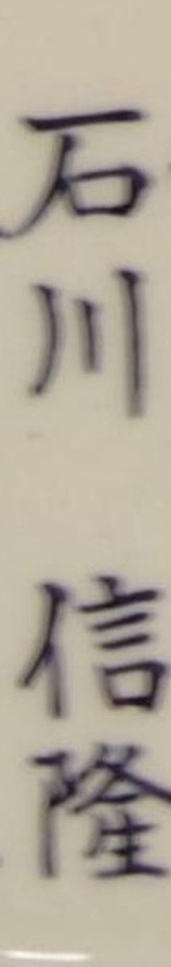石川信隆
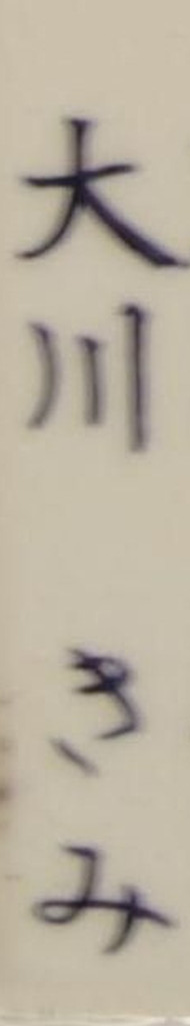大川きみ

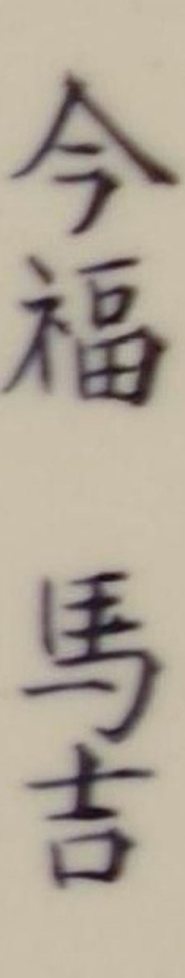今福馬吉
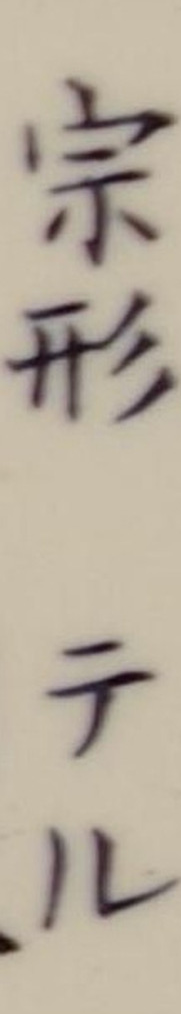宗形テル
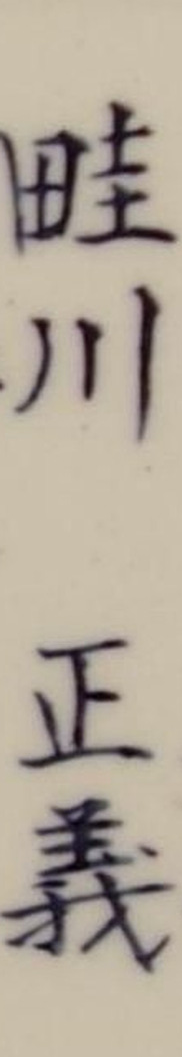畦川正義
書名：E~L
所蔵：高野山金剛峯寺
